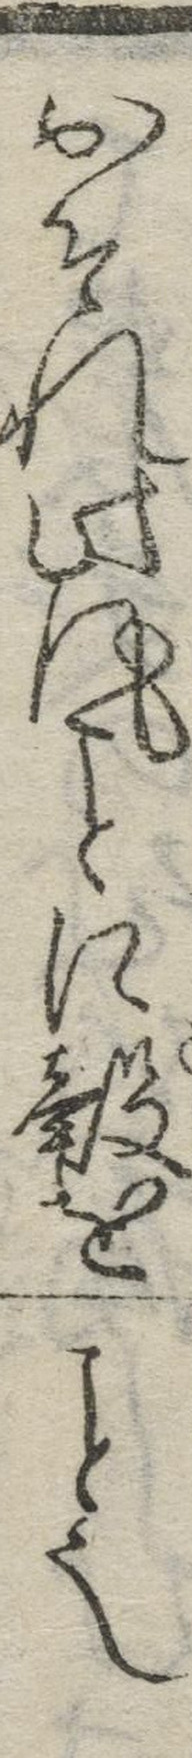おそれ此風ことに穀を
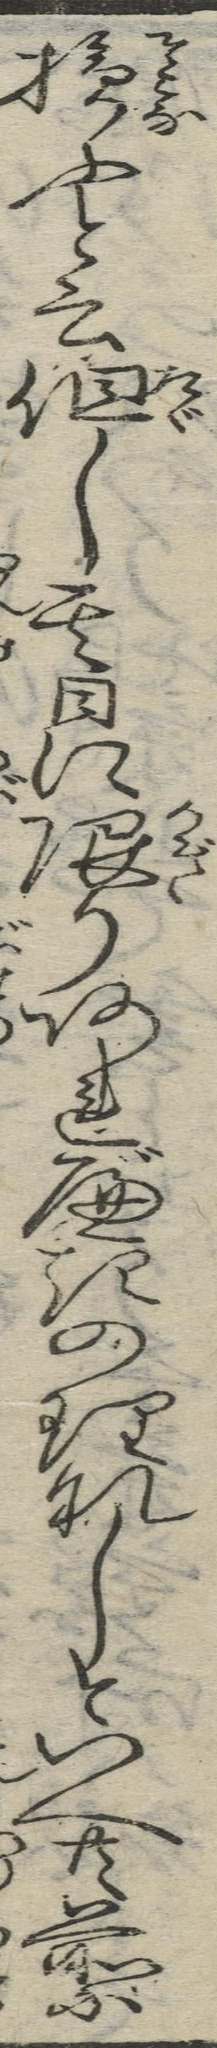損ふと云但し其日に限りあれべきの理なしといへ共前に
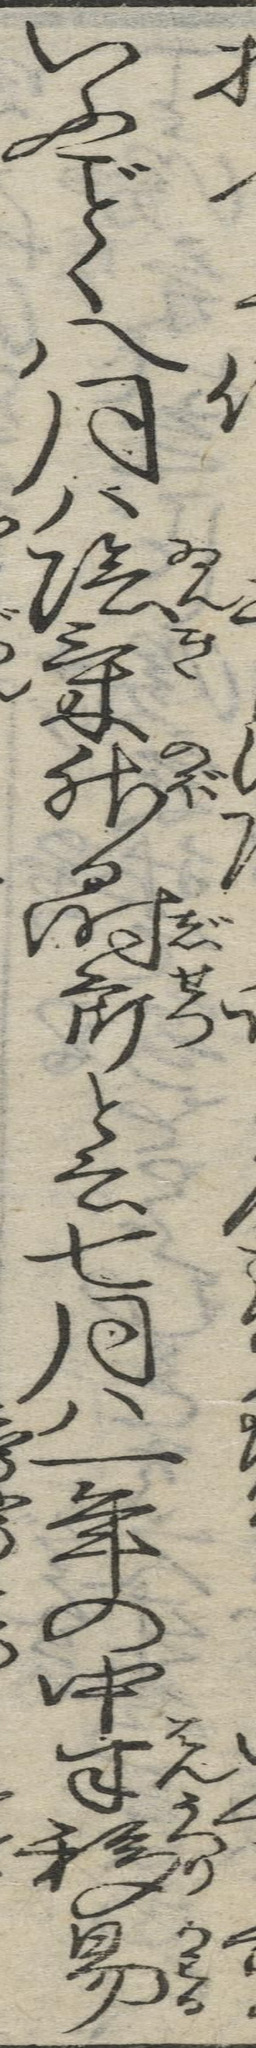いふごとく八月ハ陰気升る時節と云七月ハ一年の中半移易
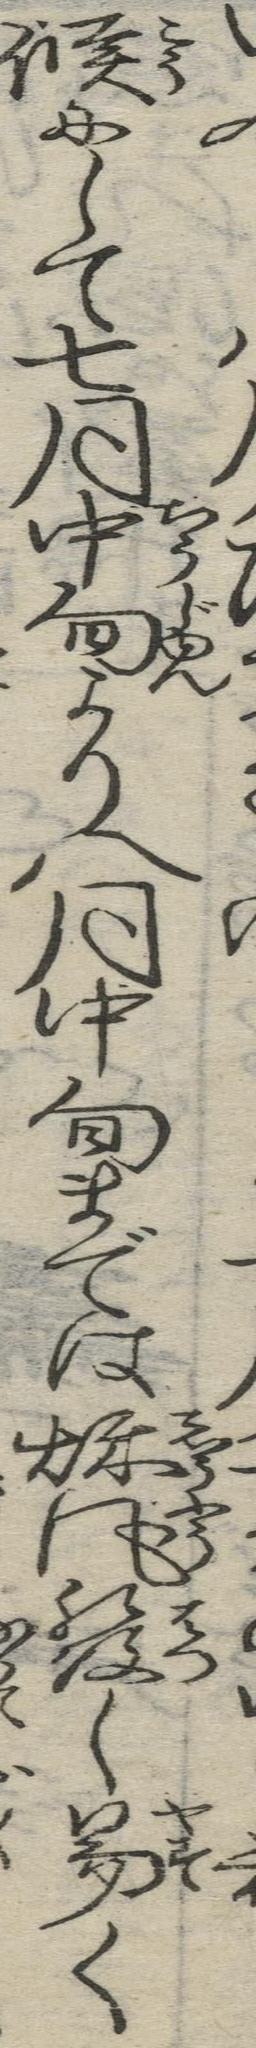候にして七月中旬より八月中旬までは秋風発し易く
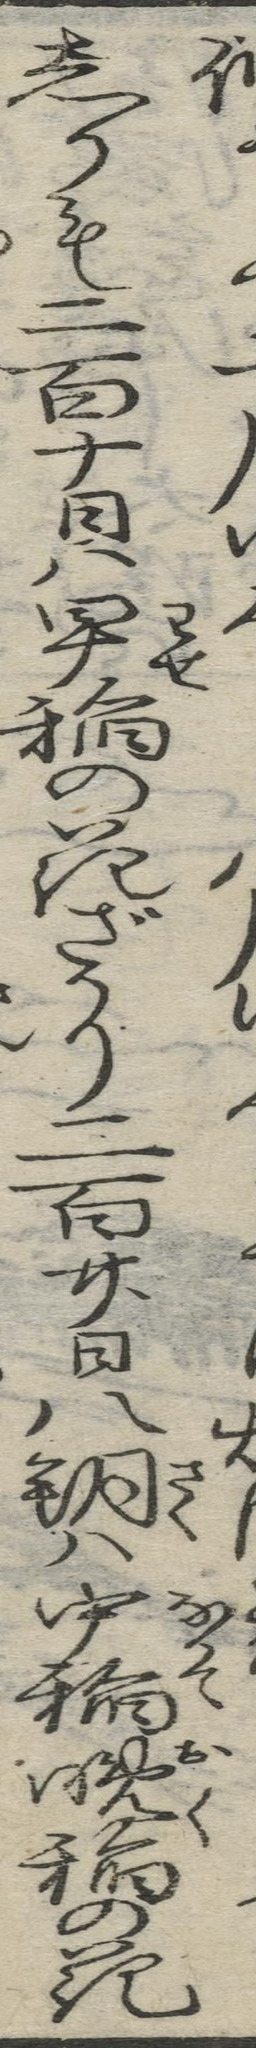しかも二百十日ハ早稲の花ざかり二百廿日八朔ハ中稲晩稲の花
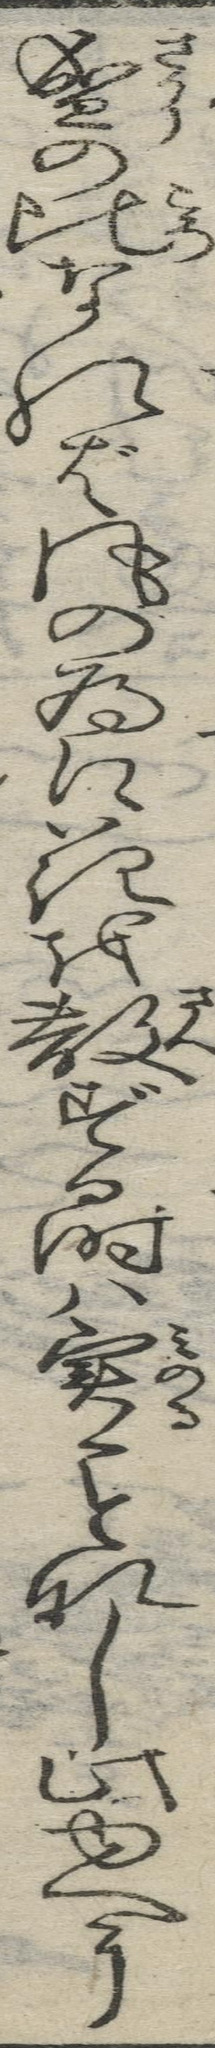盛の比なれば風の為に花を散ずる時ハ実ことなし此ゆへに
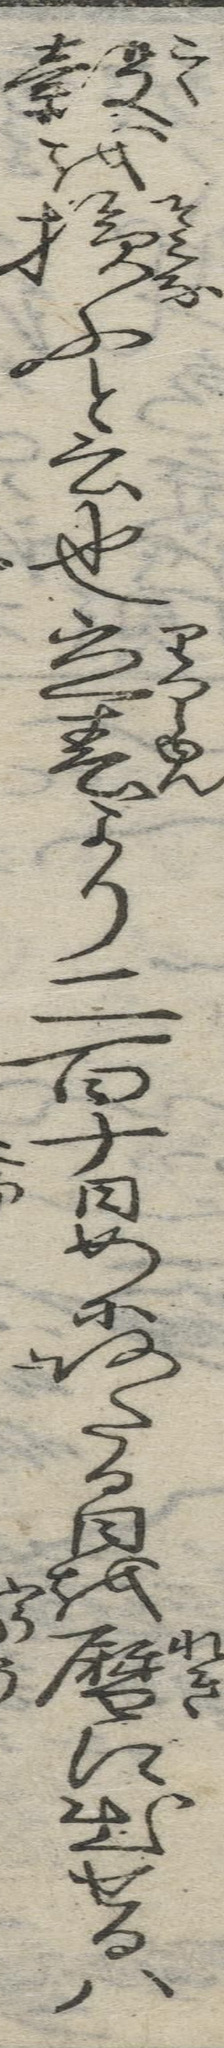穀を損ふと云也立春より二百十日めにあたる日を暦に出せるハ
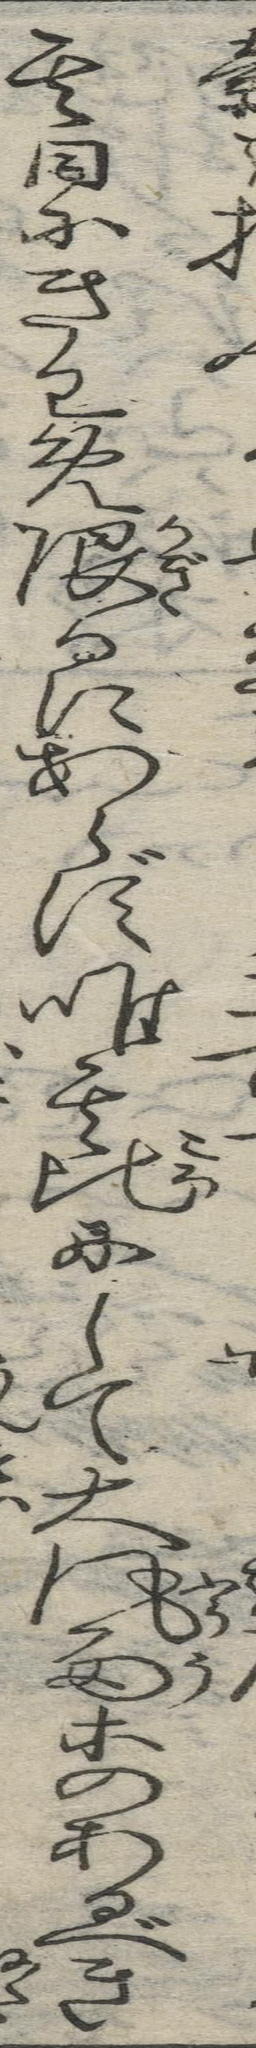其日にきわめ限るにあらず唯其比にして大風雨等のあるべき
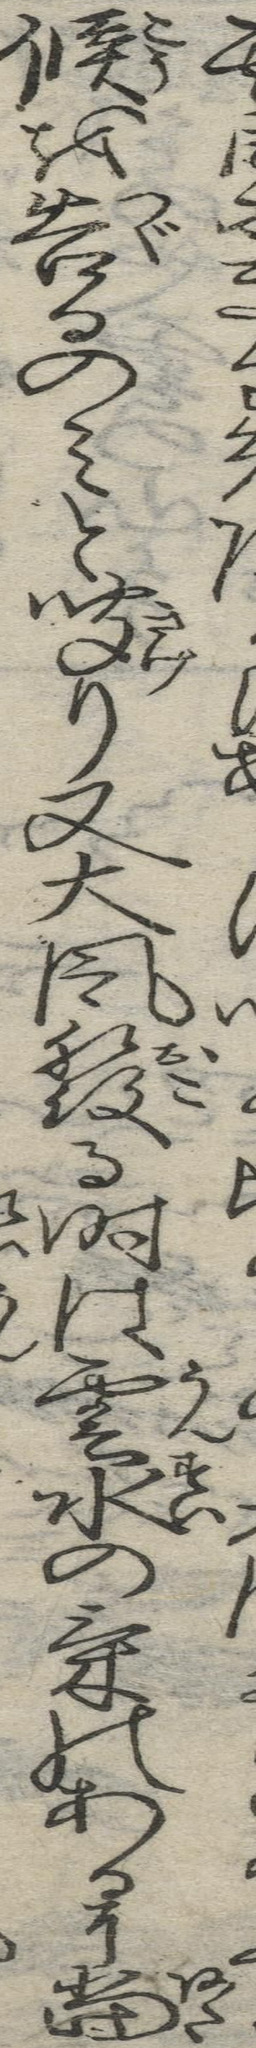候を告るのミと聞り又大風発る時は雲水の気のあるに当
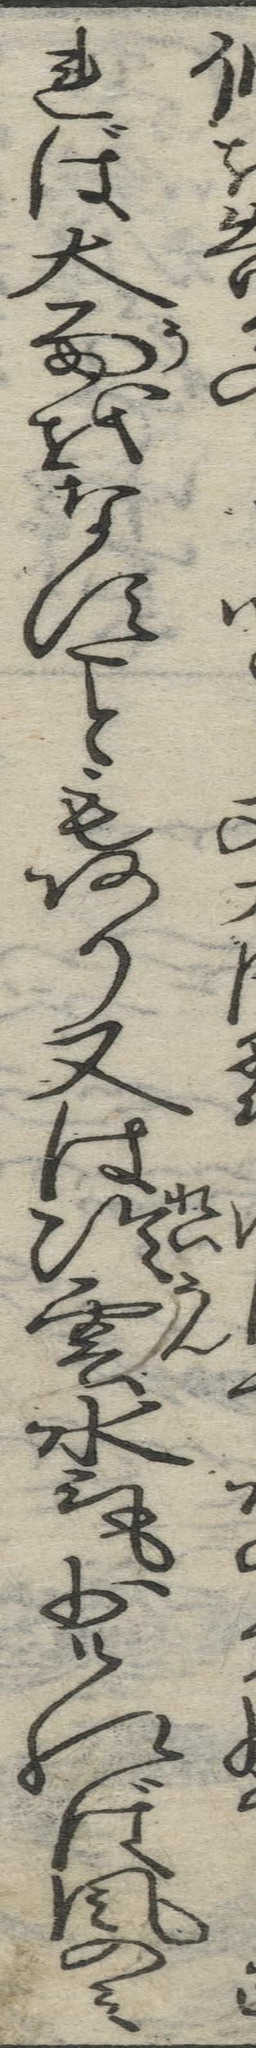れば大雨をなすこともあり又は冷雲水気少ければ風のミ
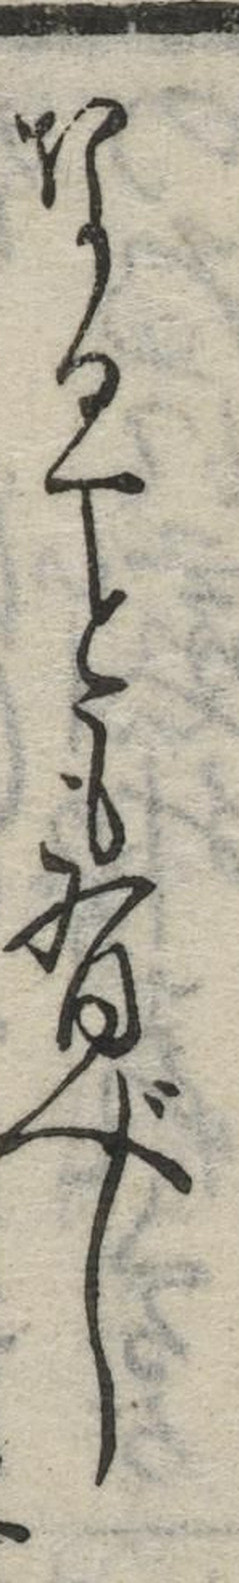なることも有べし
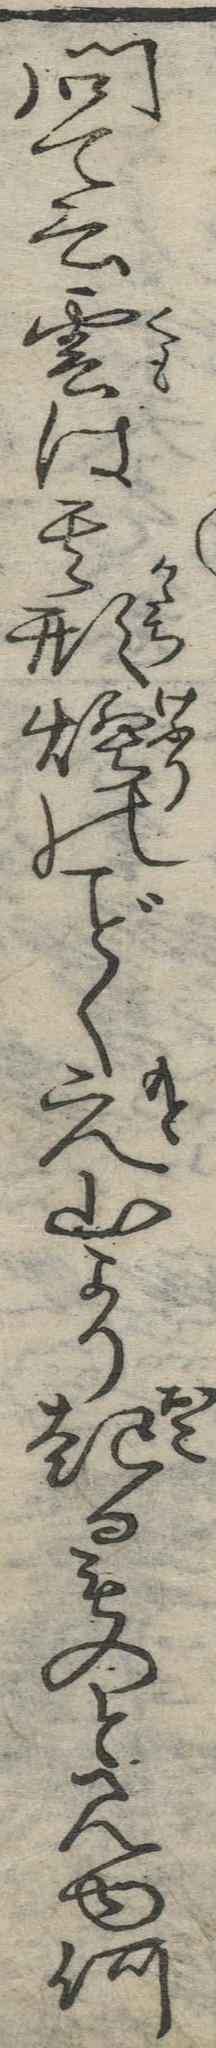問て云雲は其形煙のこどく元山より起るものと見ゆ何
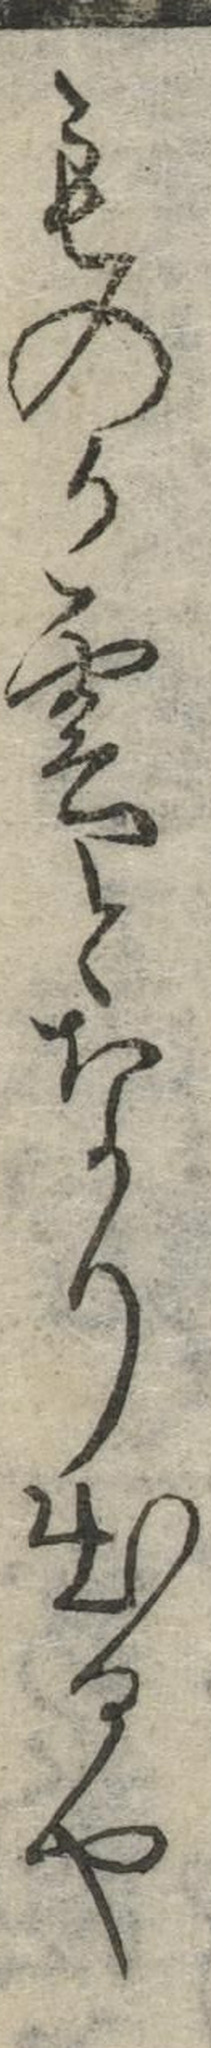ものか雲となり出るや

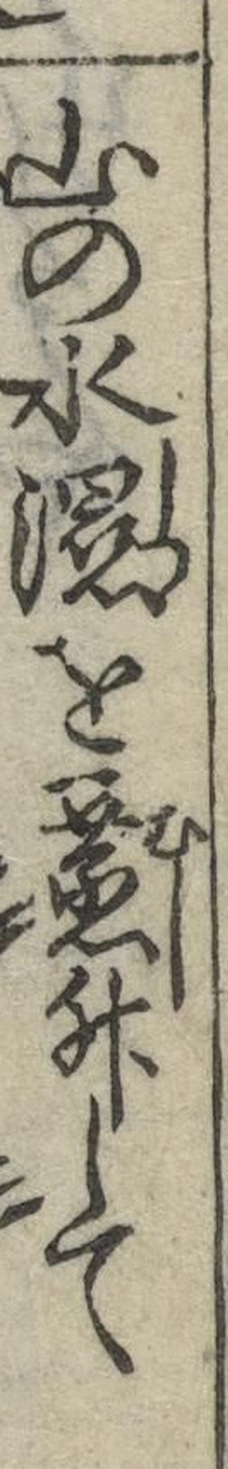山の水湿を蒸升して
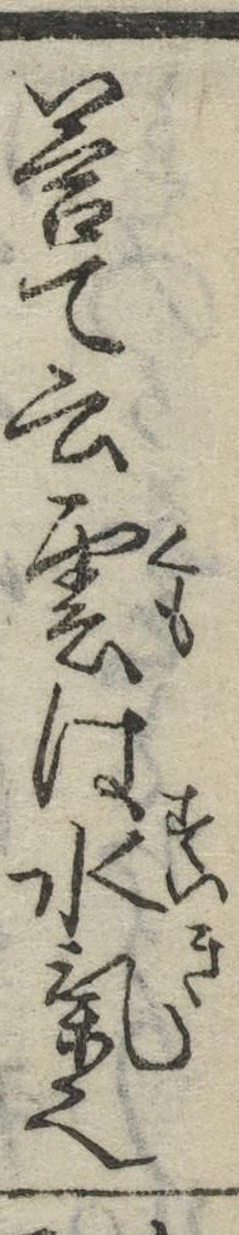答て云雲は水気也
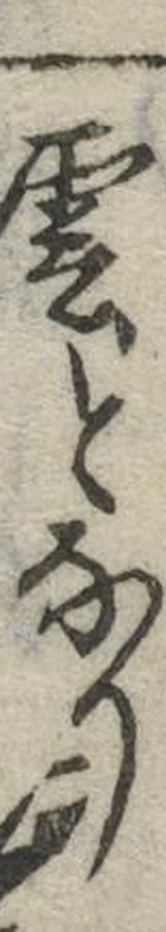雲となり
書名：訓蒙天地辨　地
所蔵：東京大学地震研究所図書室 Earthquake Research Institute Library, The University of Tokyo, JAPAN
